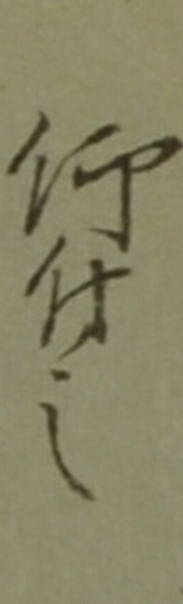仰付之
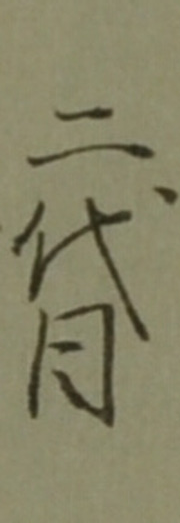二代目
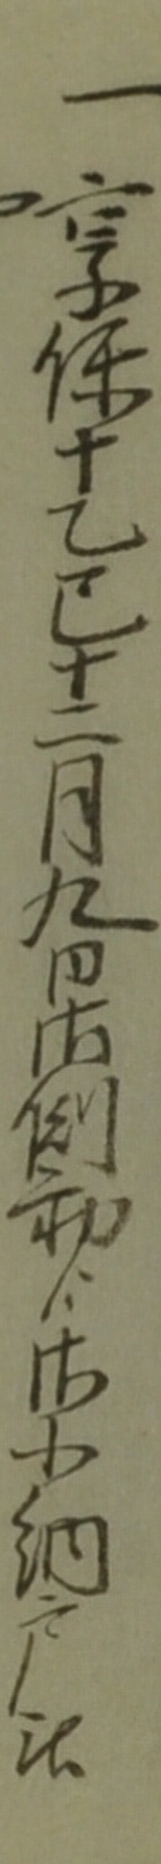一享保十乙巳十二月九日御側勤ゟ御小納戸被
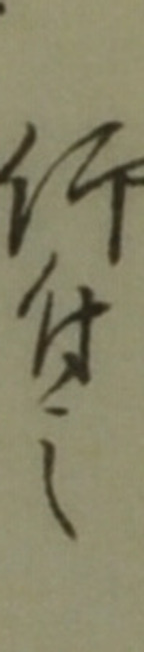仰付之
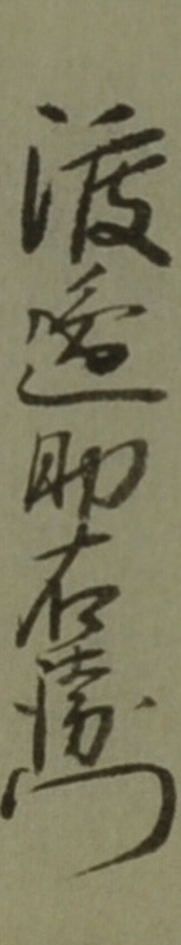渡辺助右衛門
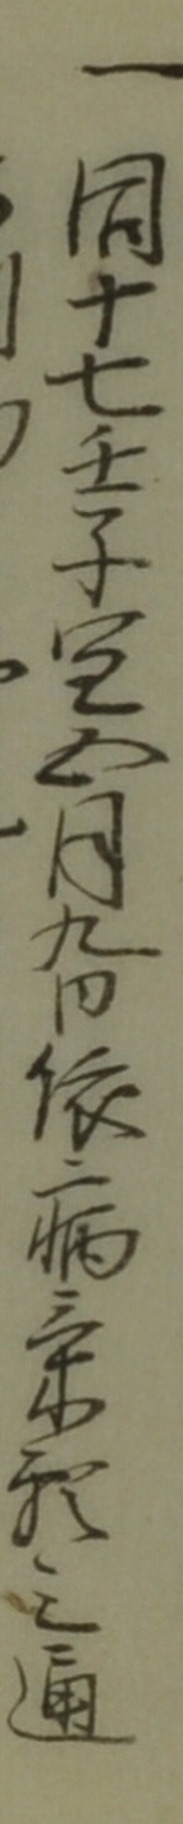一同十七壬子閏五月九日依病気願之通
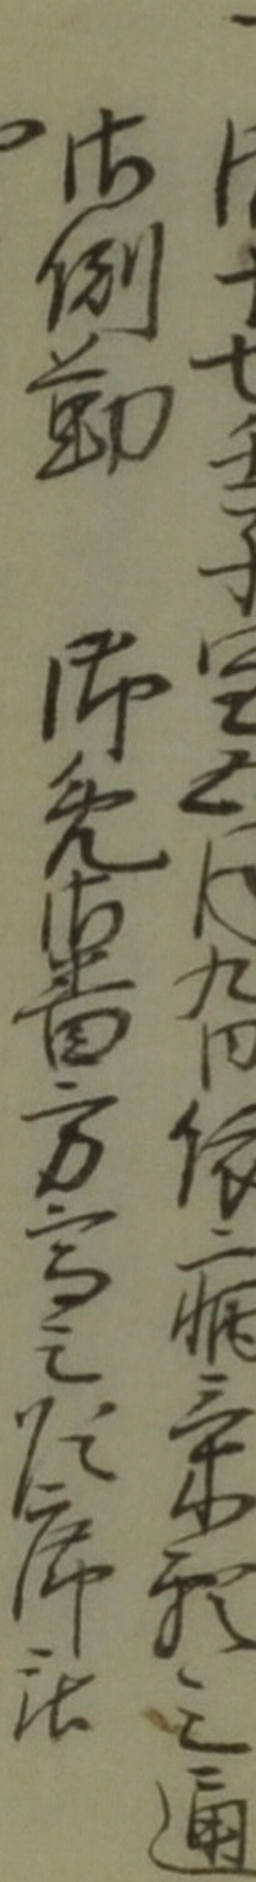御傍勤御免御番方高之順席被
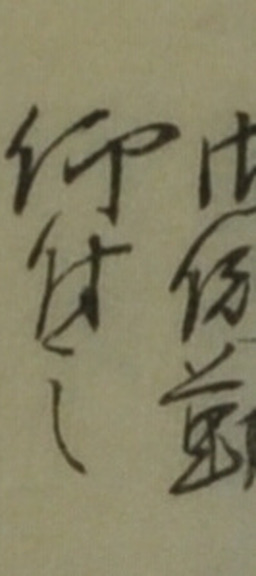仰付之
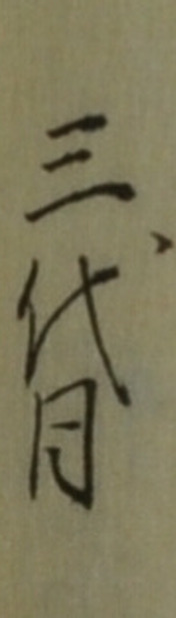三代目
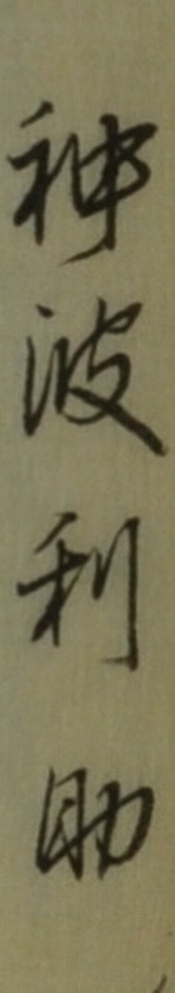神波利助
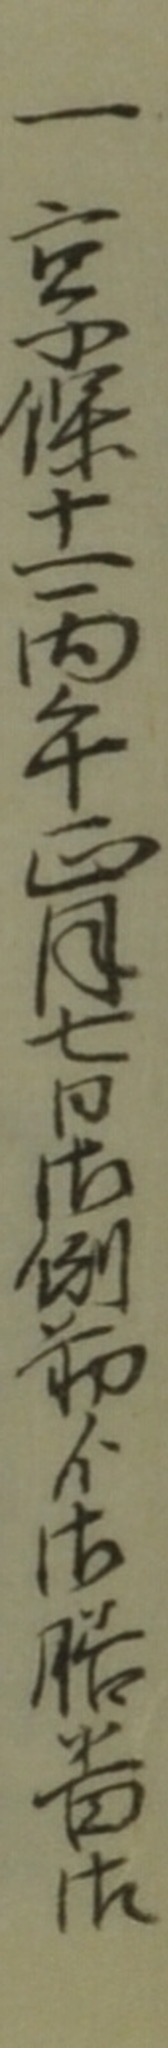一享保十一丙午正月七日御側勤ゟ御膳番御
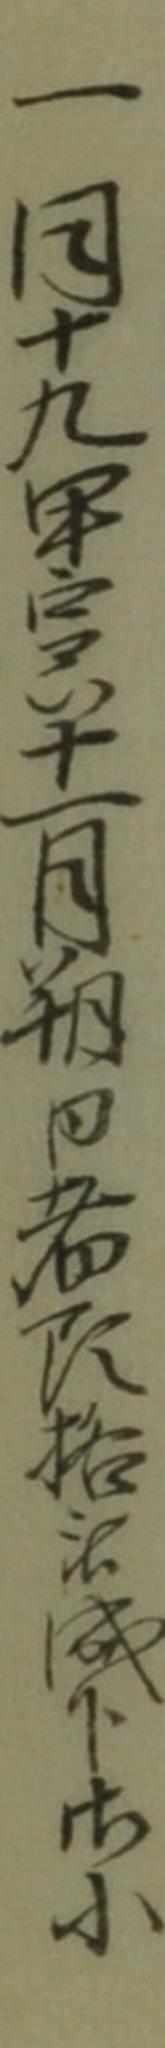一同十九甲寅十一月朔日者頭格被成下御小
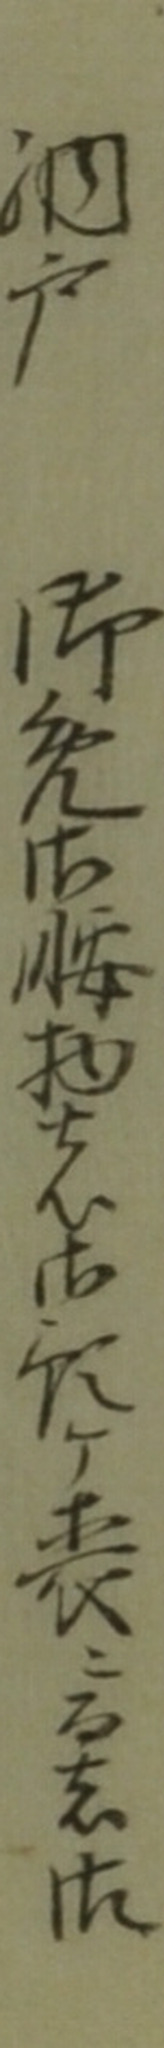納戸御免御腰物者御預ヶ表ニ而者御
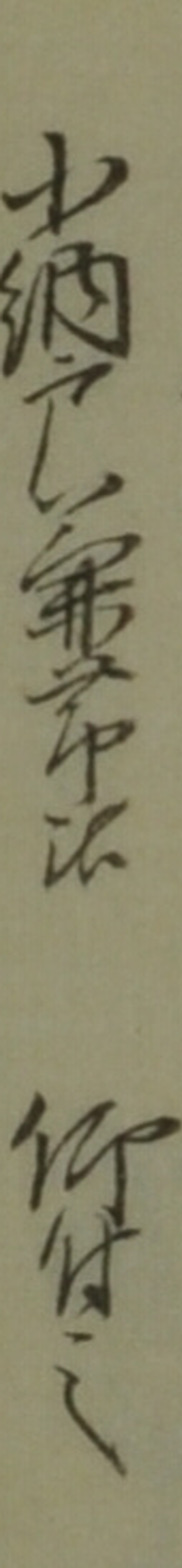小納戸兼帯被仰付之
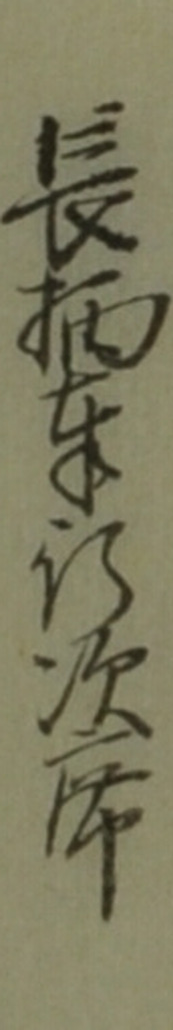長柄奉行次席
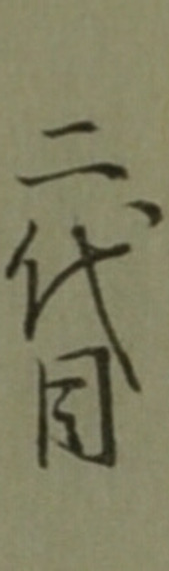二代目
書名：諸御役代々録（四）
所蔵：伊那市立高遠町図書館・合同会社AMANE
